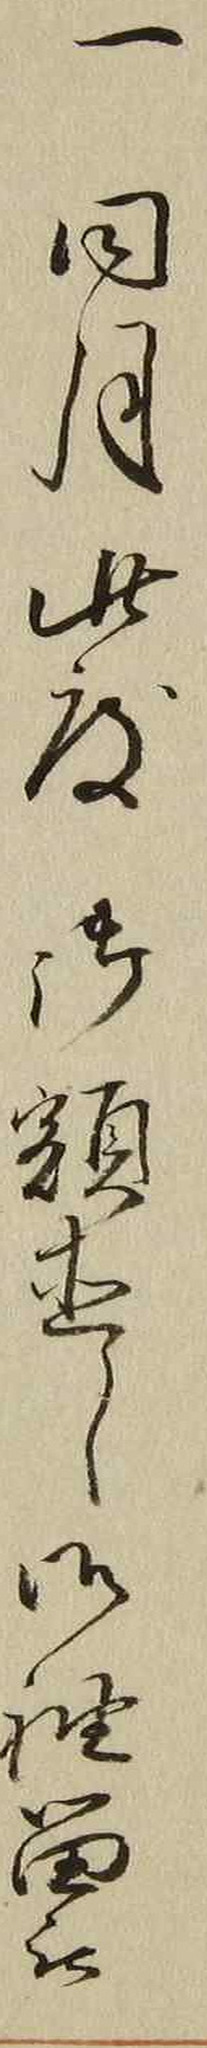一同月此度御額直し御袖留被
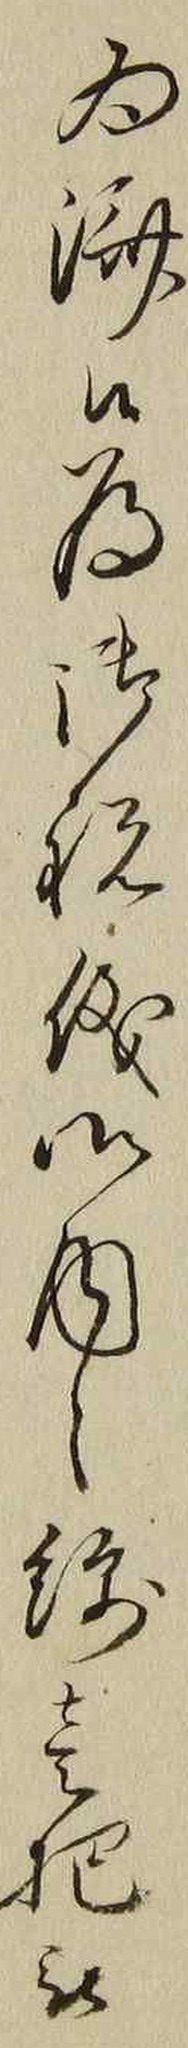為済候為御祝儀御内々綿壱把被
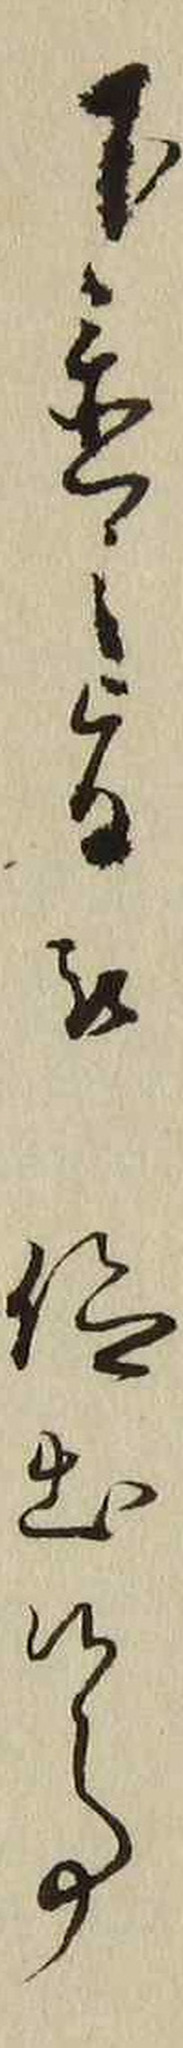下置の旨被仰出候事
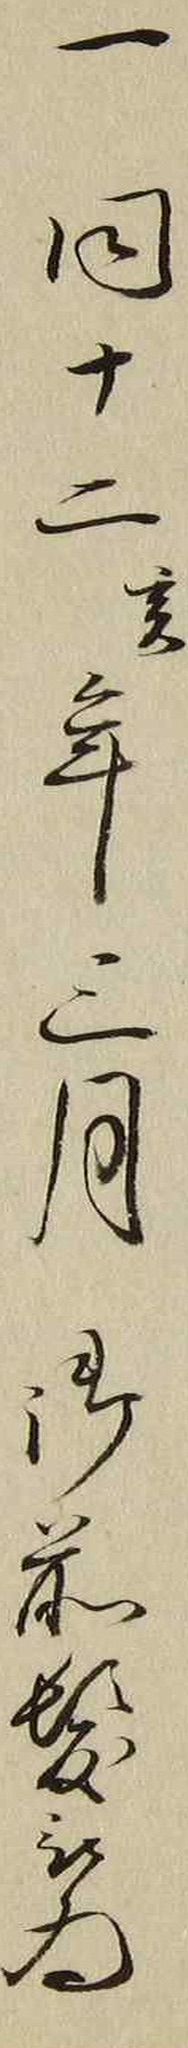一同十二亥年三月御前髪被為
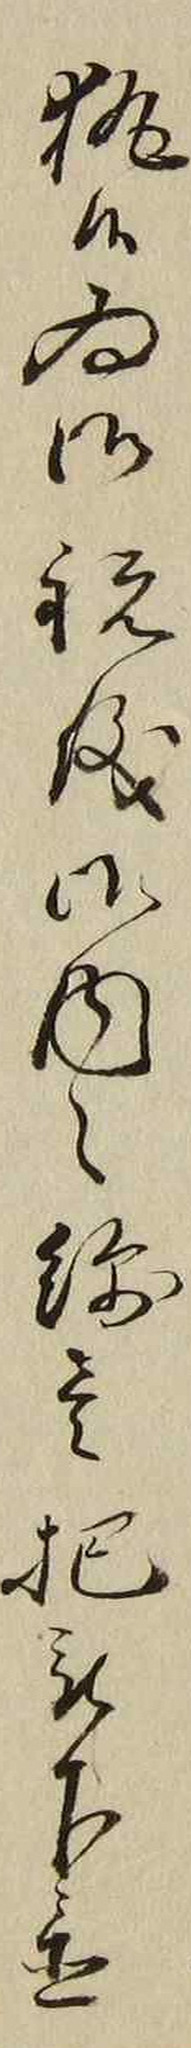執候為御祝儀御内々綿壱把被下置
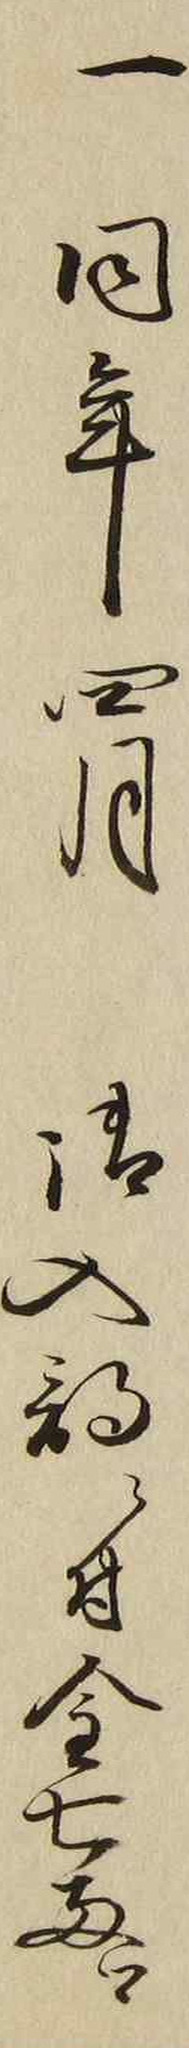一同年四月御入部に付金七両ツヽ

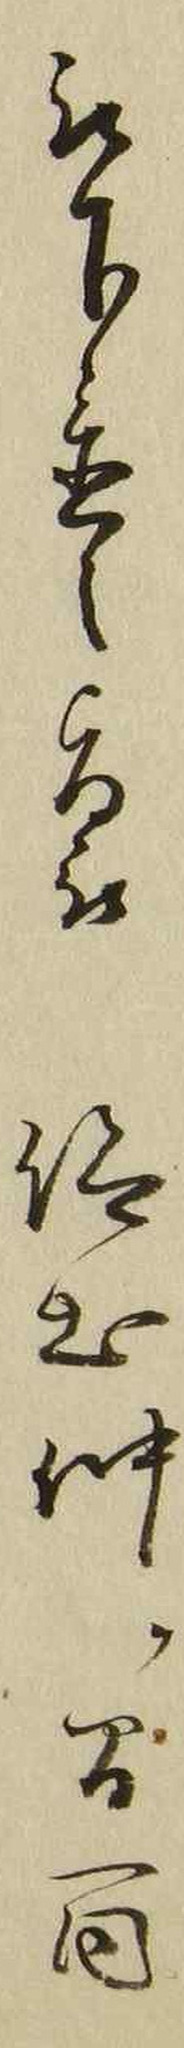被下置の旨被仰出仲ケ間一同
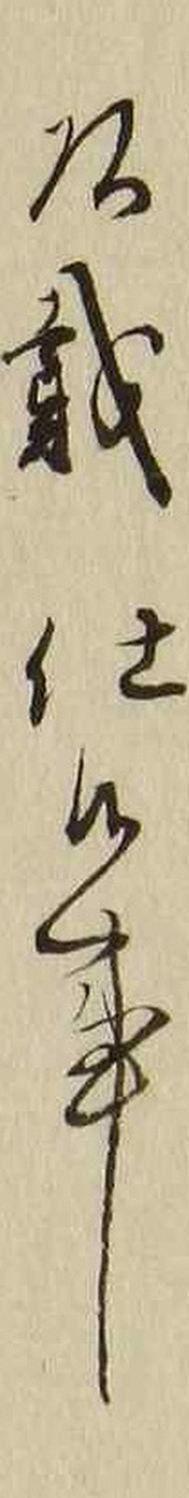頂戴仕候事
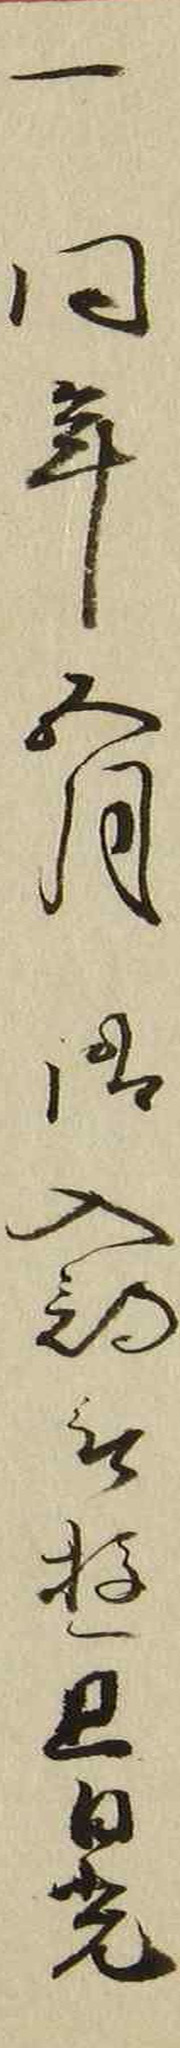一同年五月御入部被遊且日光
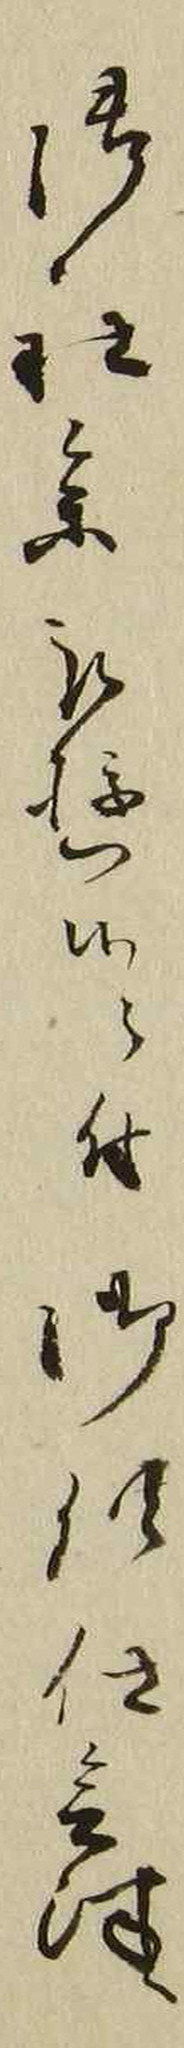御社参被遊候に付御供仕会津へ
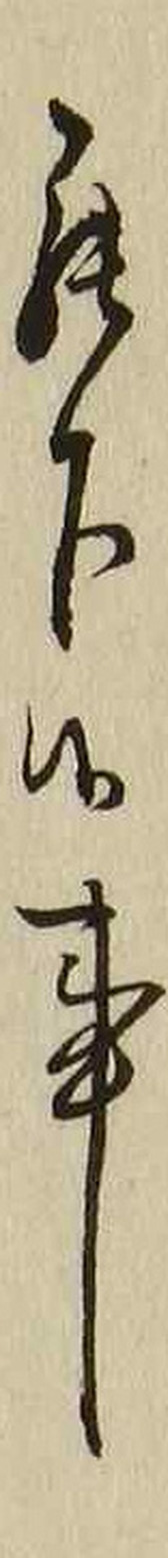罷下候事
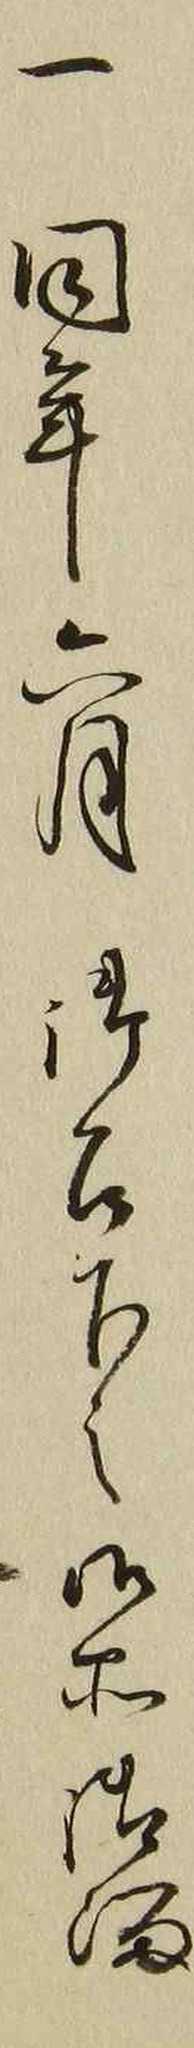一同年六月御召下の御品御溜
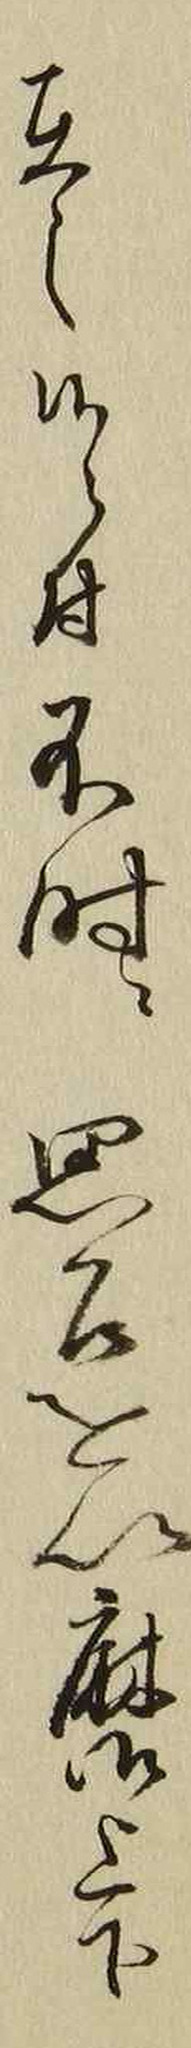在之候に付不時に思召を以麻御上下
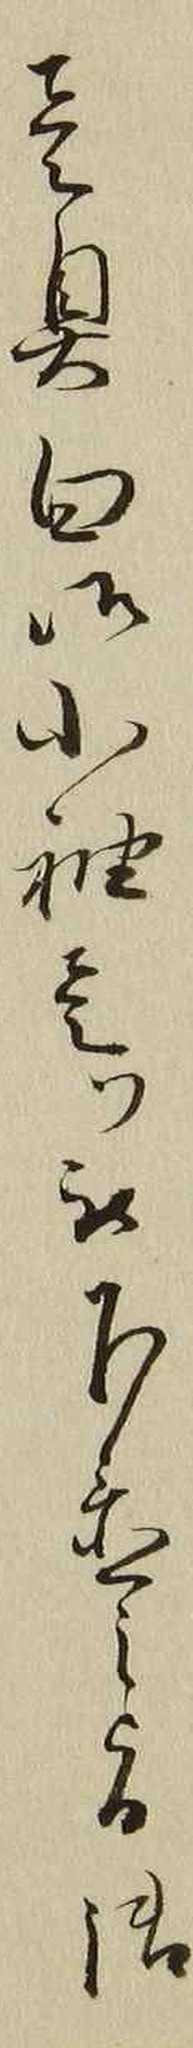壱具白御小袖壱ツ被下置の旨御
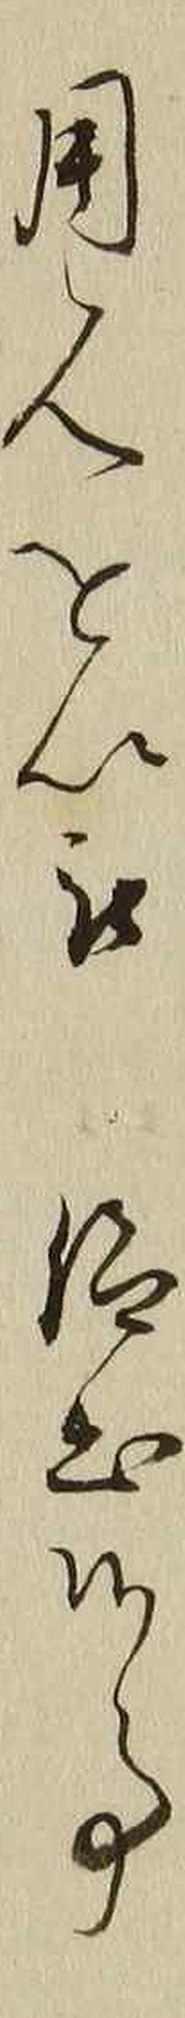用人を以被仰出候事
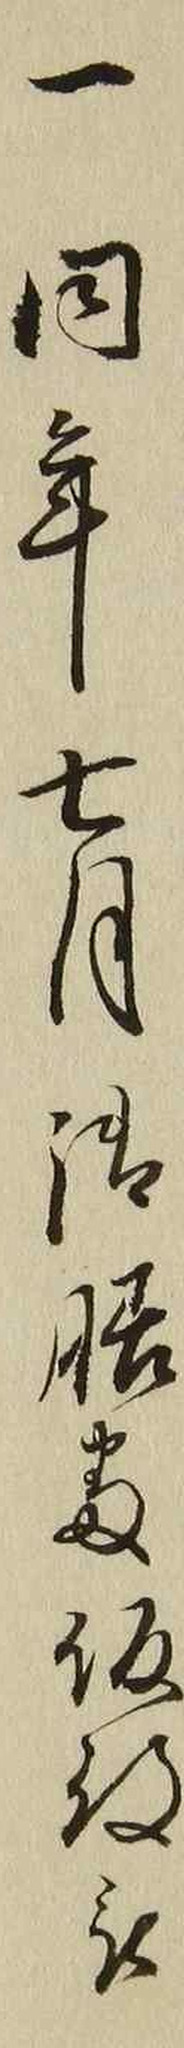一同年七月御膳番仮役被
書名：諸士系譜　巻之1　い之部1
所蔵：会津若松市立会津図書館
